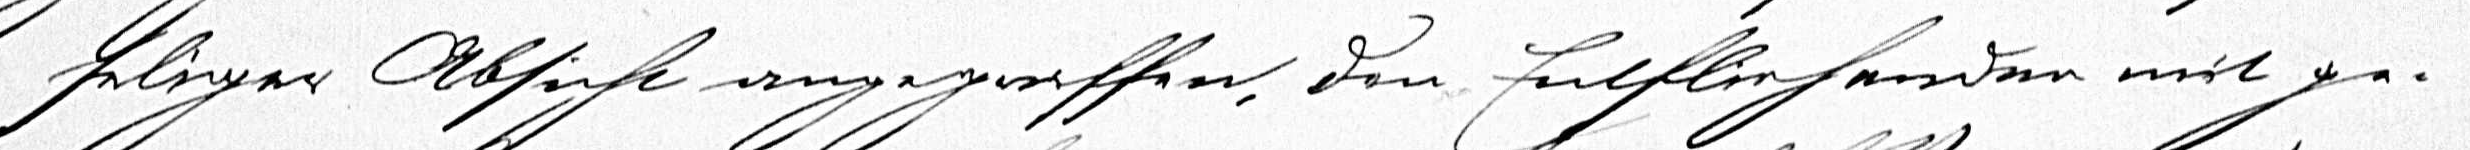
seliger Absicht angegriffen, den Entfliehenden mit ge¬
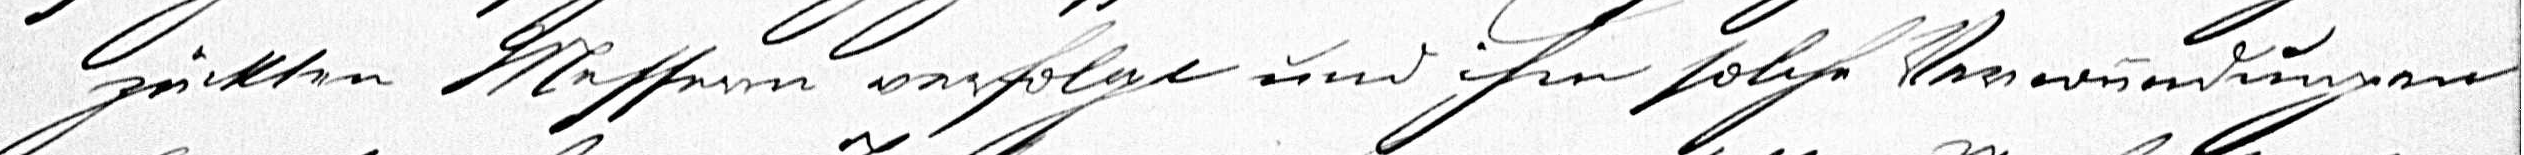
zückten Messern verfolgt und ihn solche Verwundungen
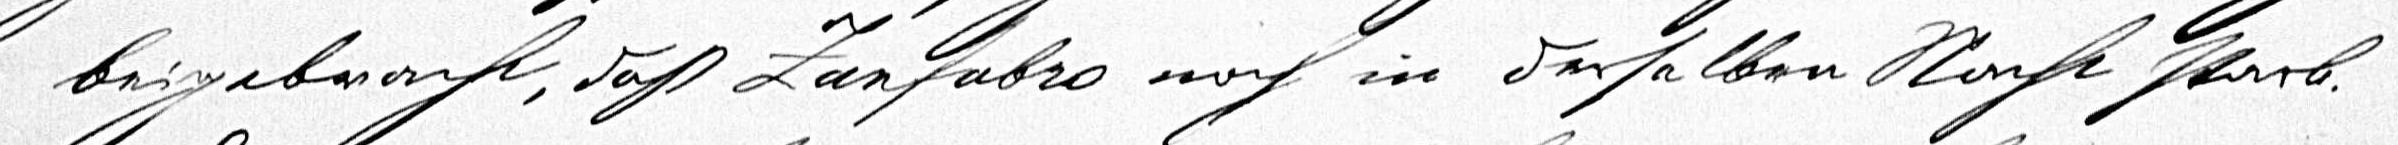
beigebracht, daß Zanfabro noch in derselben Nacht starb.
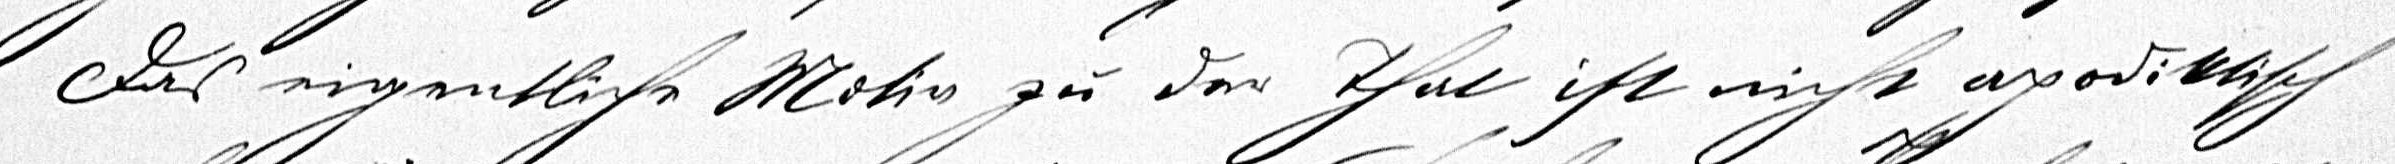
Das eigentliche Motiv zu der That ist nicht apodiktisch
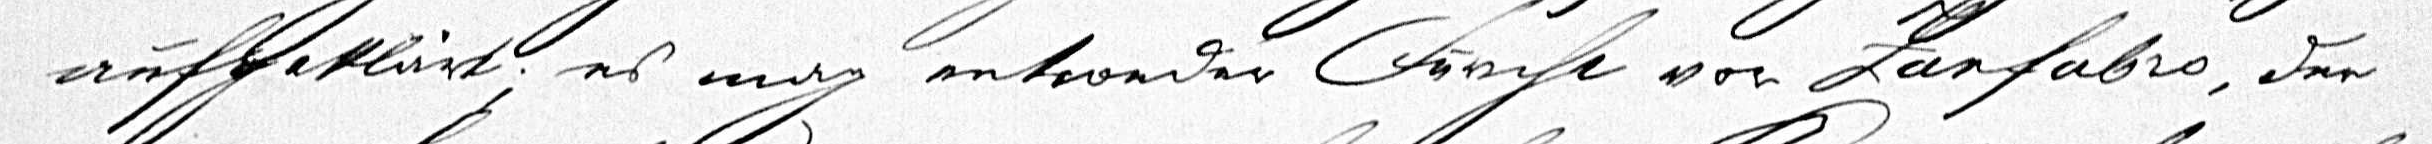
aufgeklärt; es mag entweder Furcht vor Zanfabro, der
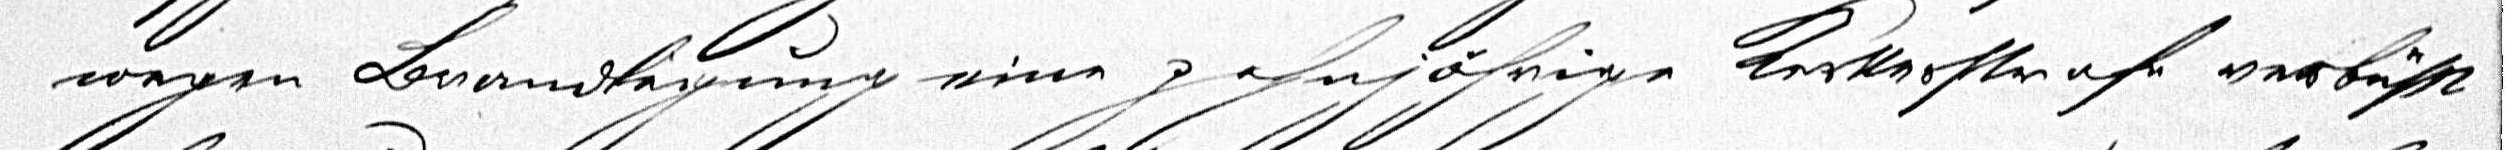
wegen Brandlegung eine zehnjährige Kerkerstrafe verbüßt
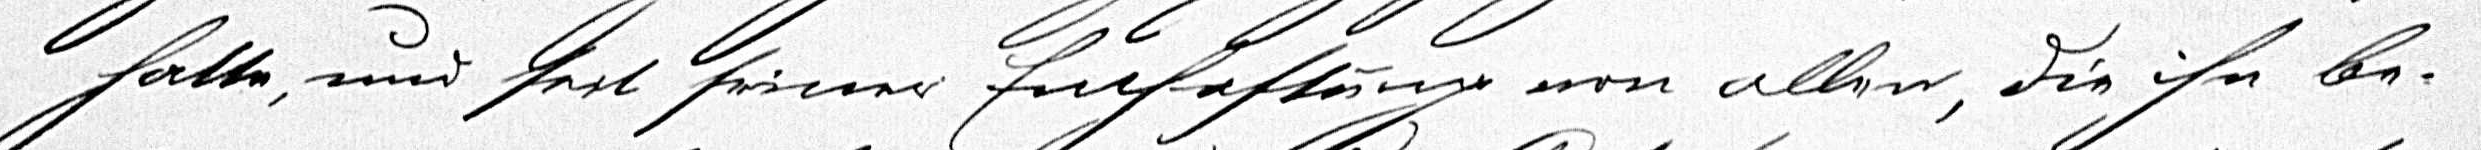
hatte, und seit seiner Enthaftung von allen, die ihn be¬
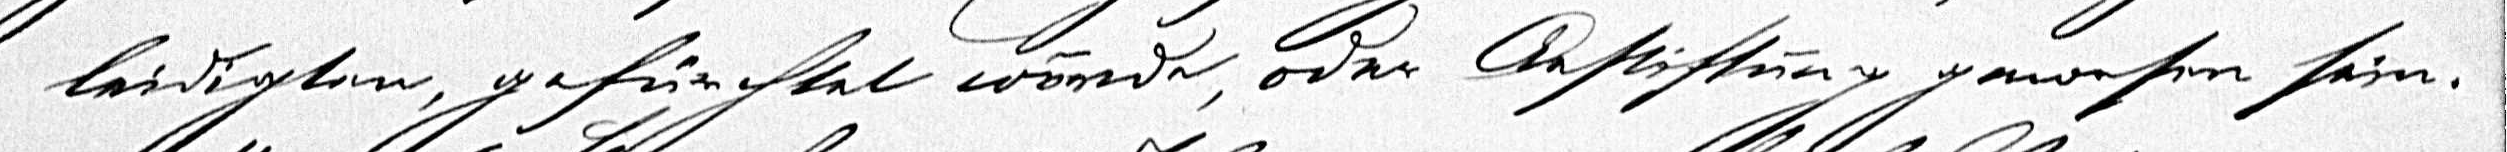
leidigten, gefürchtet wurde, oder Anstiftung gewesen sein.
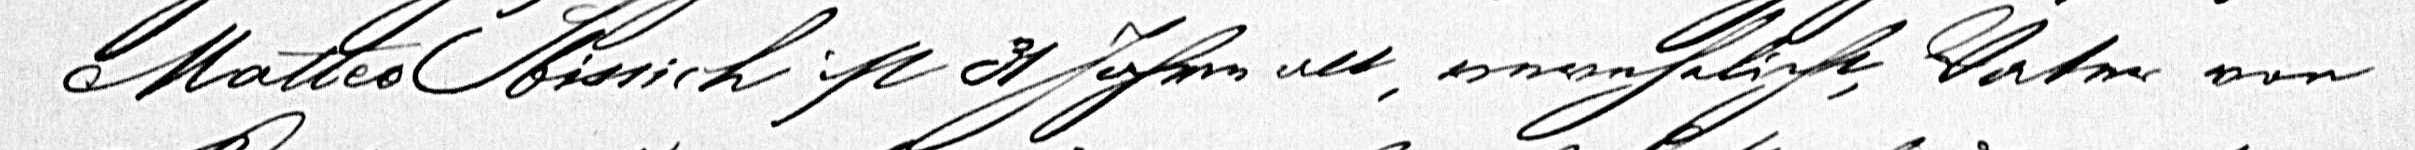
Matteo Sbissich ist 31 Jahren alt, verehelicht, Vater von
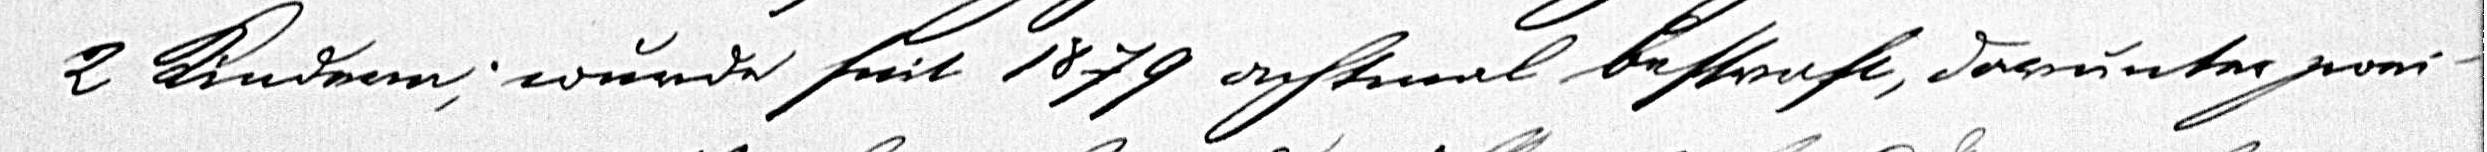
2 Kindern; wurde seit 1879 achtmal bestraft, darunter zwei¬
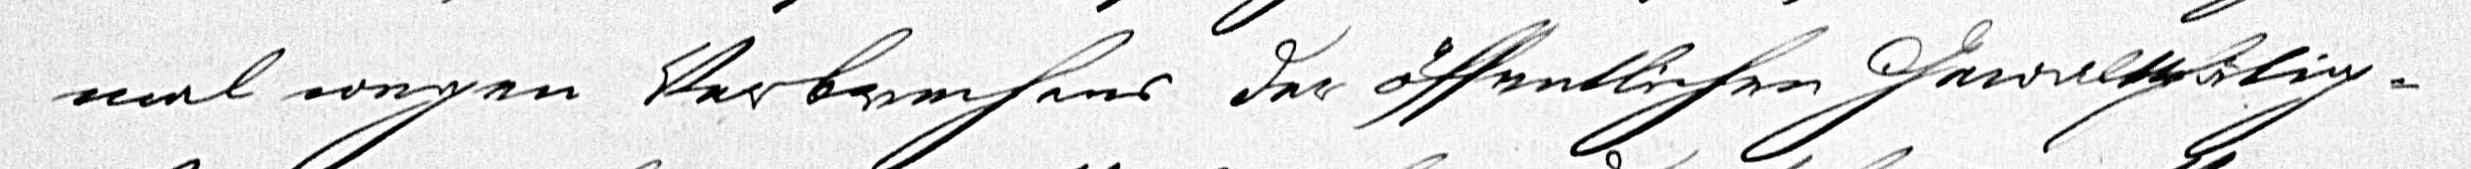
mal wegen Verbrechens der öffentlichen Gewaltthätig¬
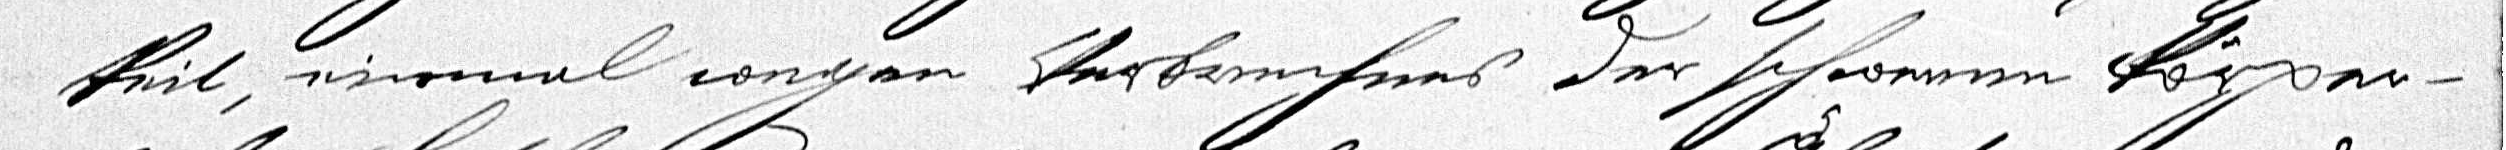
keit, einmal wegen Verbrechens der schweren Körper¬
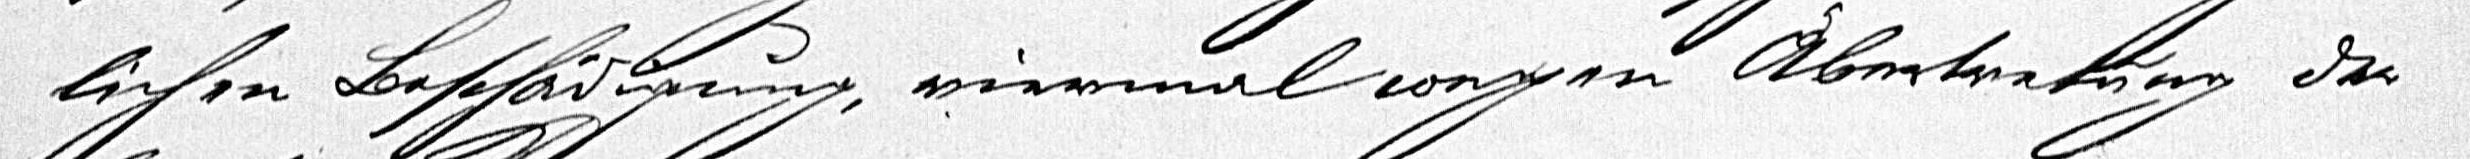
lichen Beschädigung, viermal wegen Übertretung der
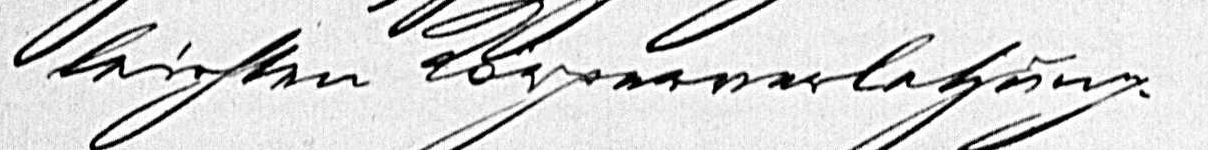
leichten Körperverletzung.
